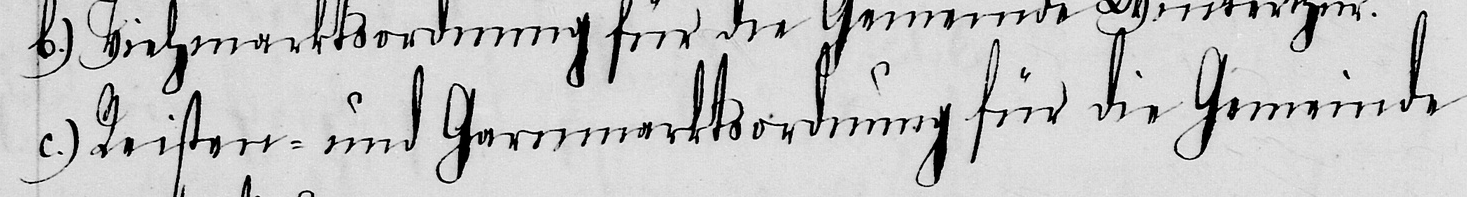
c.) Reisten- und Garnmarktsordnung für die Gemeinde
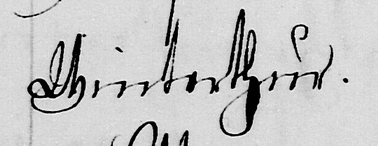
Winterthur.
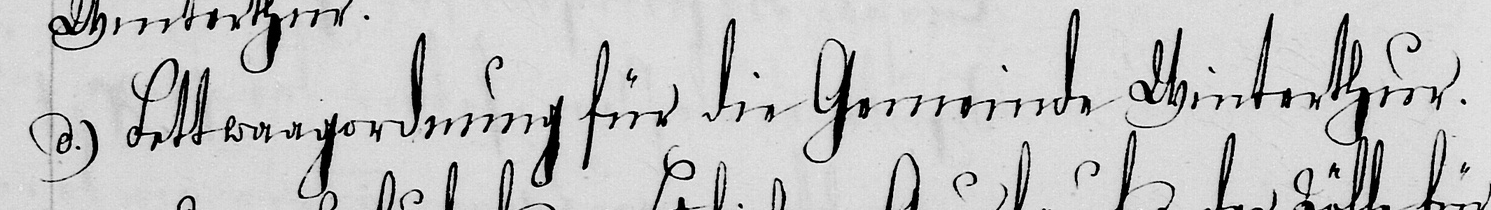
d.) Fettwaagordnung für die Gemeinde Winterthur.
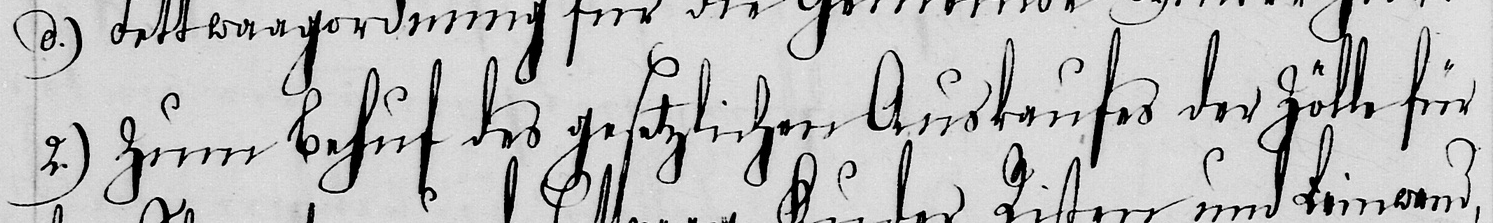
2.) Zum Behuf des gesetzlichen Auskaufes der Zölle für
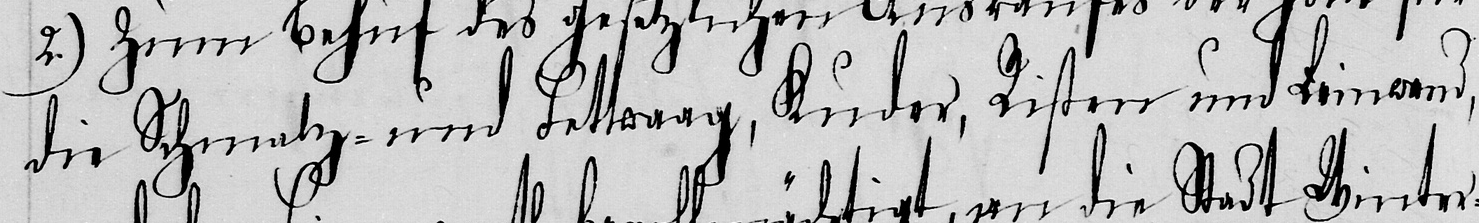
die Schmalz- und Fettwaag, Kuder, Risten und Leinwan¬
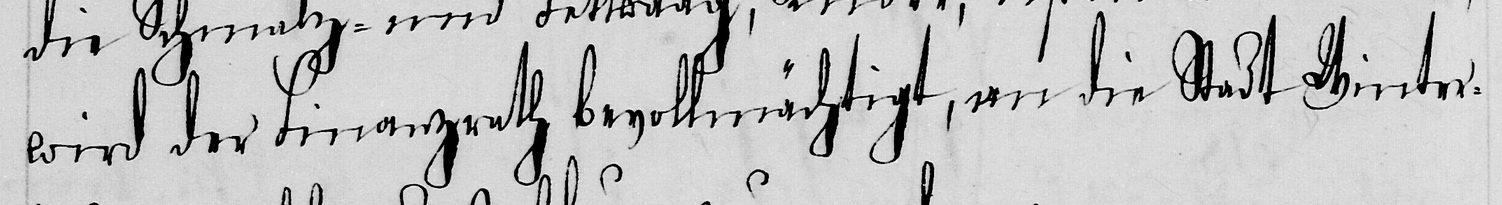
wird der Finanzrath bevollmächtigt, an die Stadt Winter¬
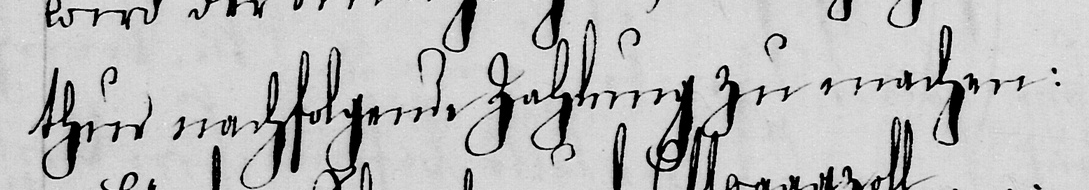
thur nachfolgende Zahlung zu machen:
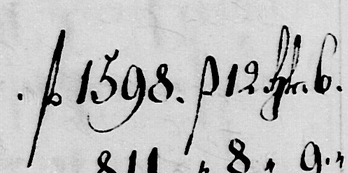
l. 1598. ß. 12 Hlr.
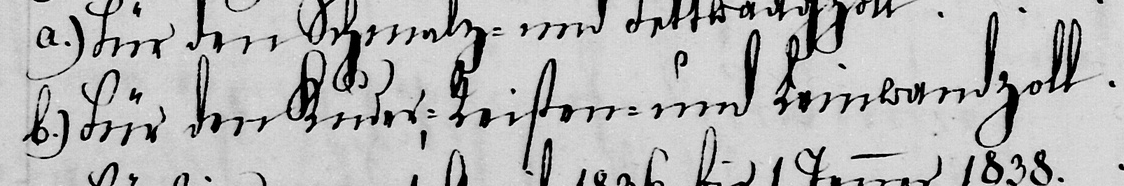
b.) Für den Kuder-, Reisten- und Leinwandzol¬
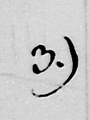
3.
